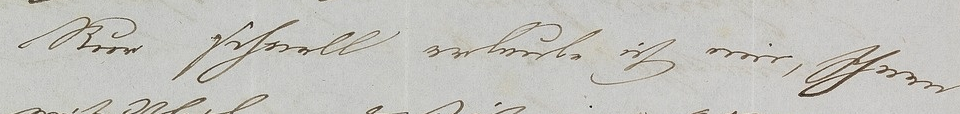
Nur schnell erlaube ich mir, Ihnen
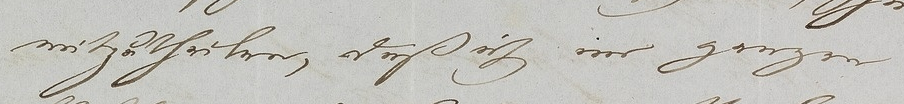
mitzutheilen, daß ich im ganzen
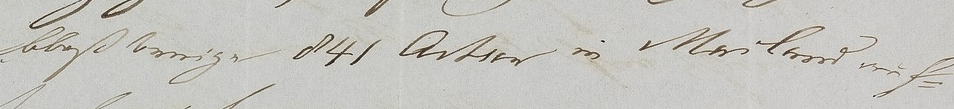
bloß wenige 841 Actien in Mailand auf-
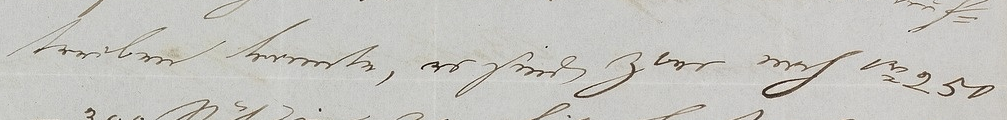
treiben konnte, es sind zwar noch ca 250
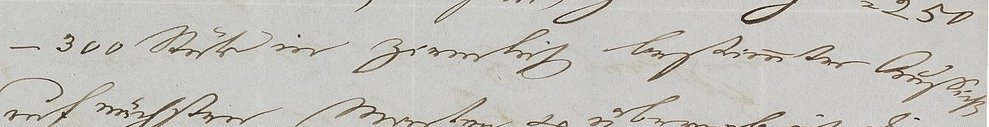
–300 Stük in ziemlich bestimmter Außicht
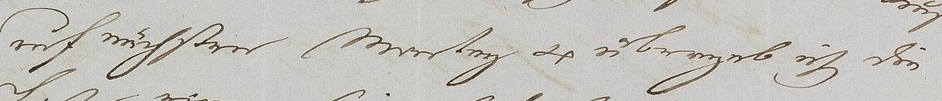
auf nächsten Montag & übergab ich die
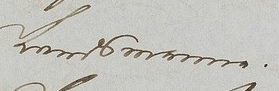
Landsmann.
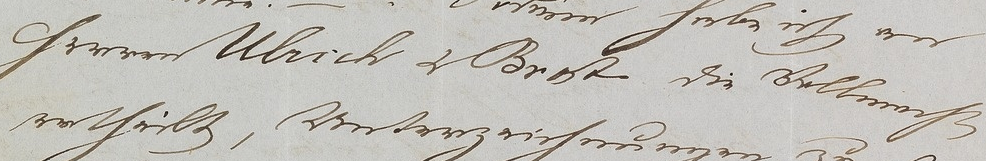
Herren Ulrich & Brot die Vollmacht
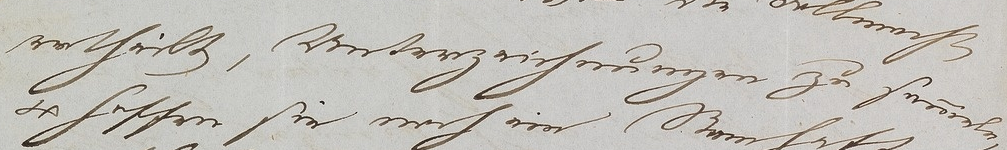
ertheilt, Unterzeichnungen zu sammeln,
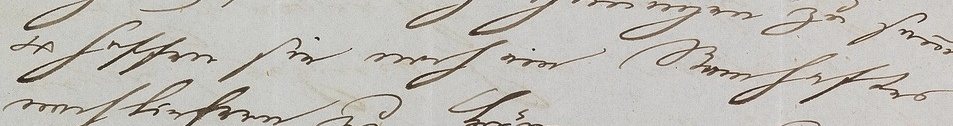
& hoffen sie noch ein Namhaftes
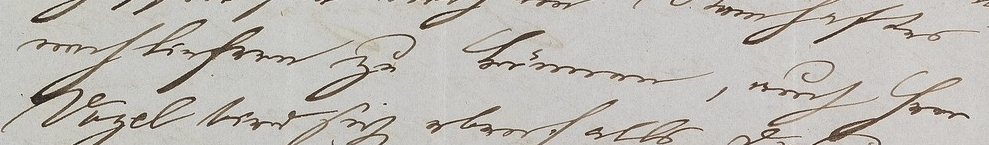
nachliefern zu können, auch Herr
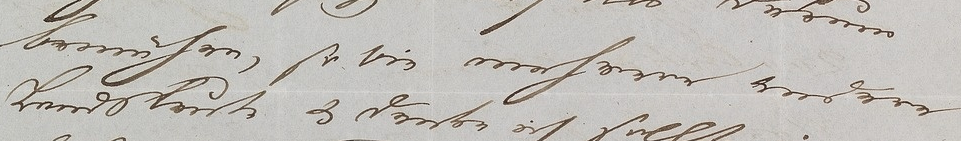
bemühen, so wie mehrere andere
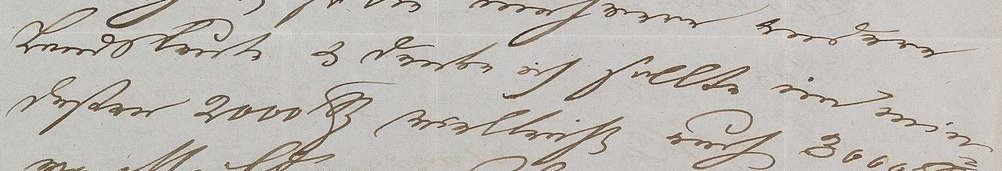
Landsleute & denke ich sollte im min-
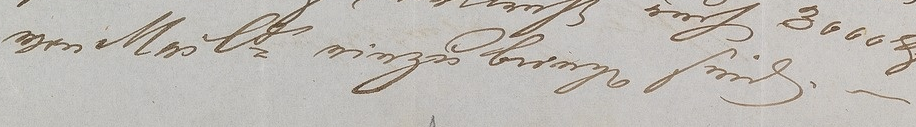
von Maild einzubringen sind.
